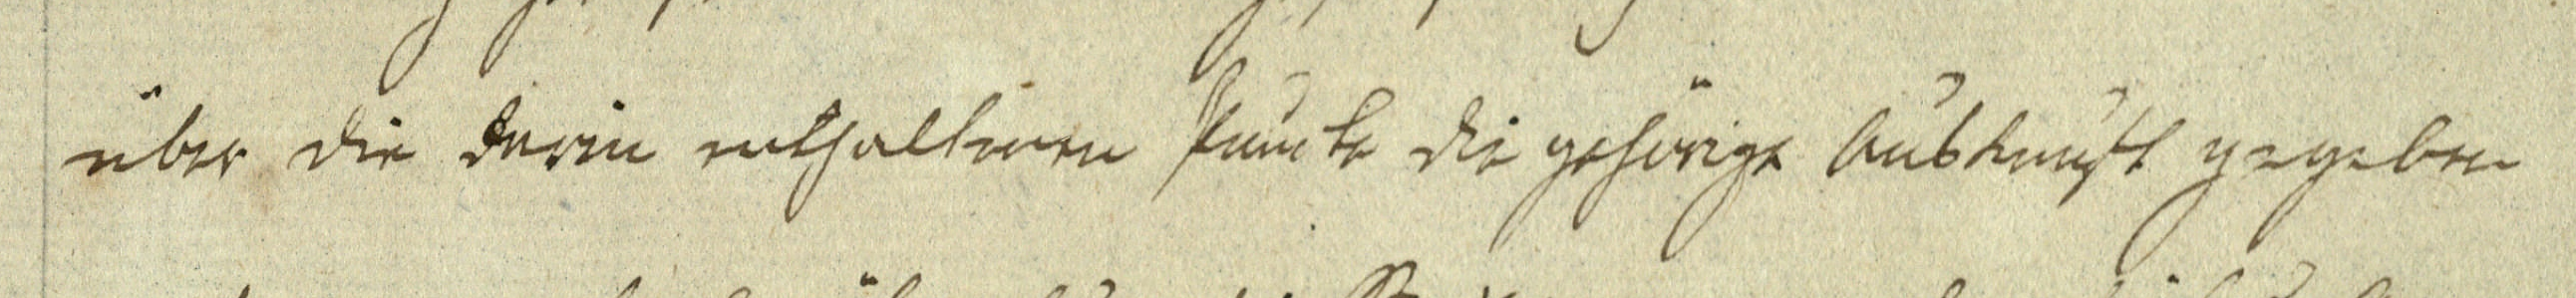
über die darin enthaltenen Puncte die gehörige Auskunft gegeben
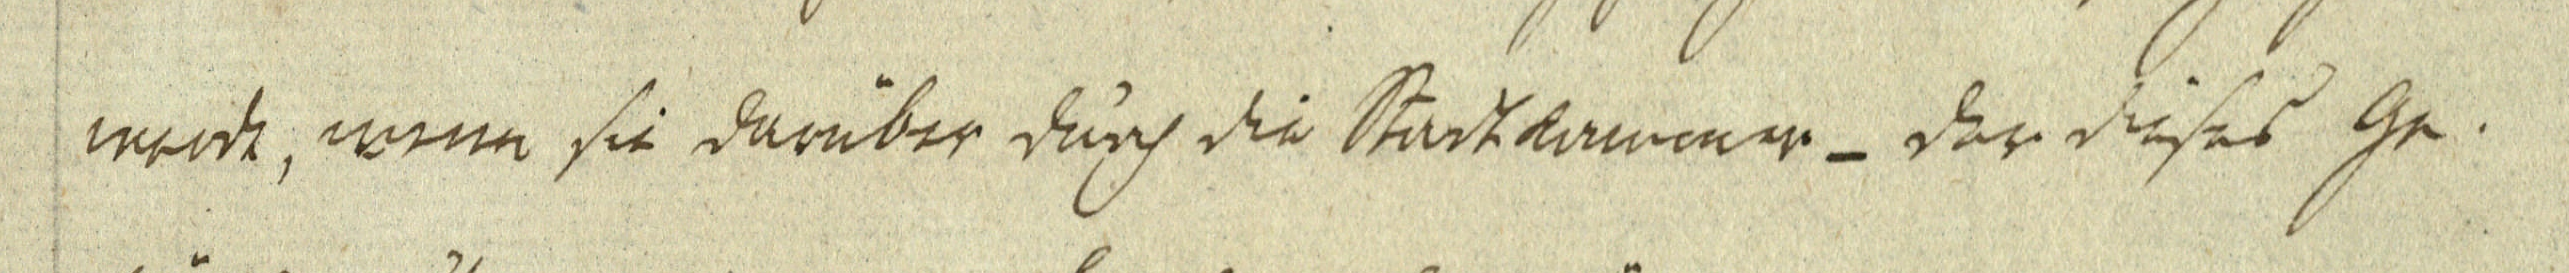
werde, wenn sie darüber durch die Stadtkammer der - dieses Ge¬
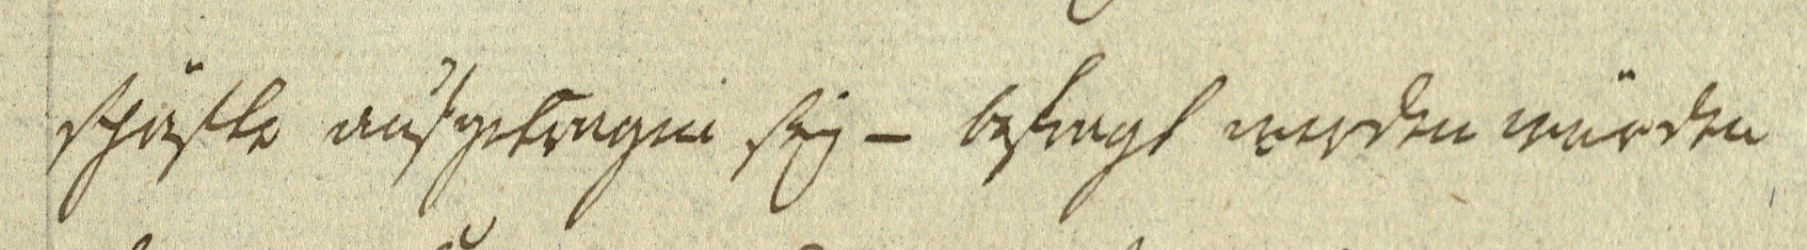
schäfte aufgetragen seÿ - befragt werden würden.
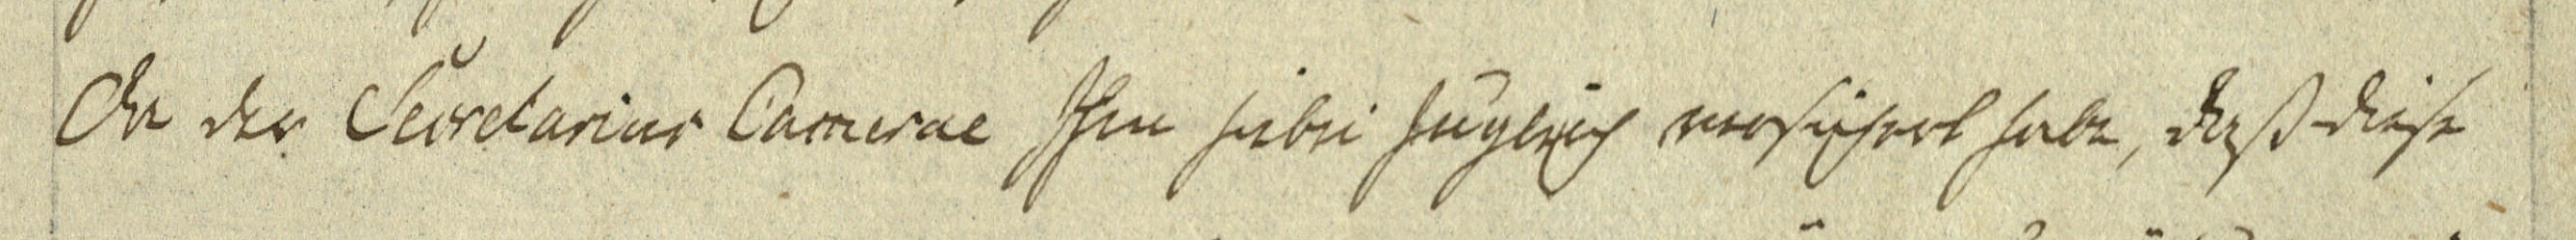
Da der Secretarius Camerae Ihm hiebei zugleich versichert habe, daß diese
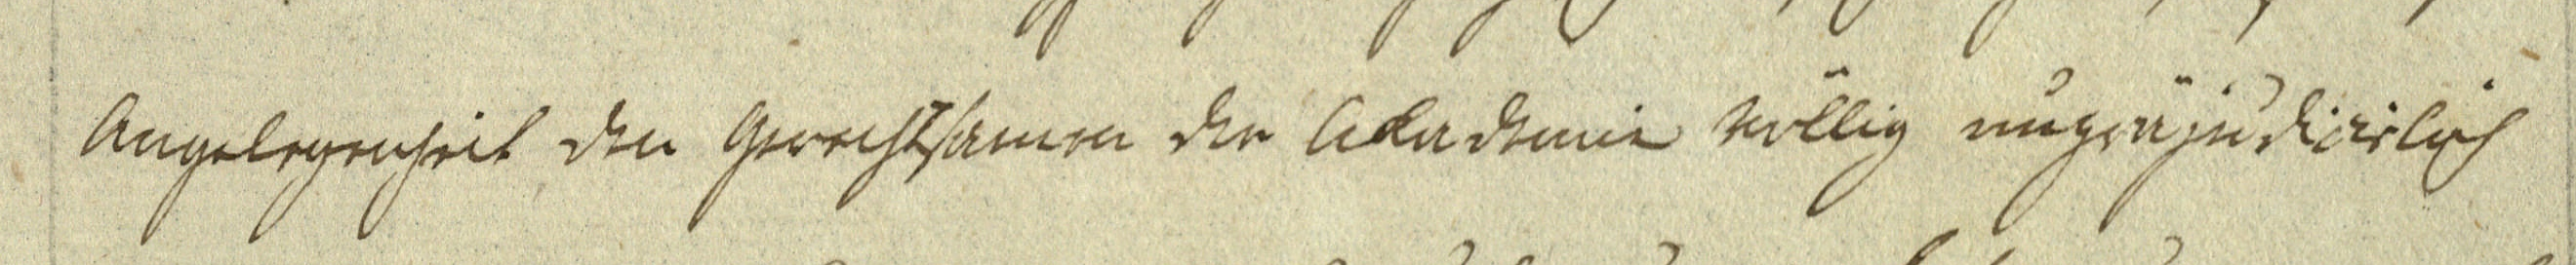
Angelegenheit den Gerechtsamen die Akademie völlig unpräjudicirlich
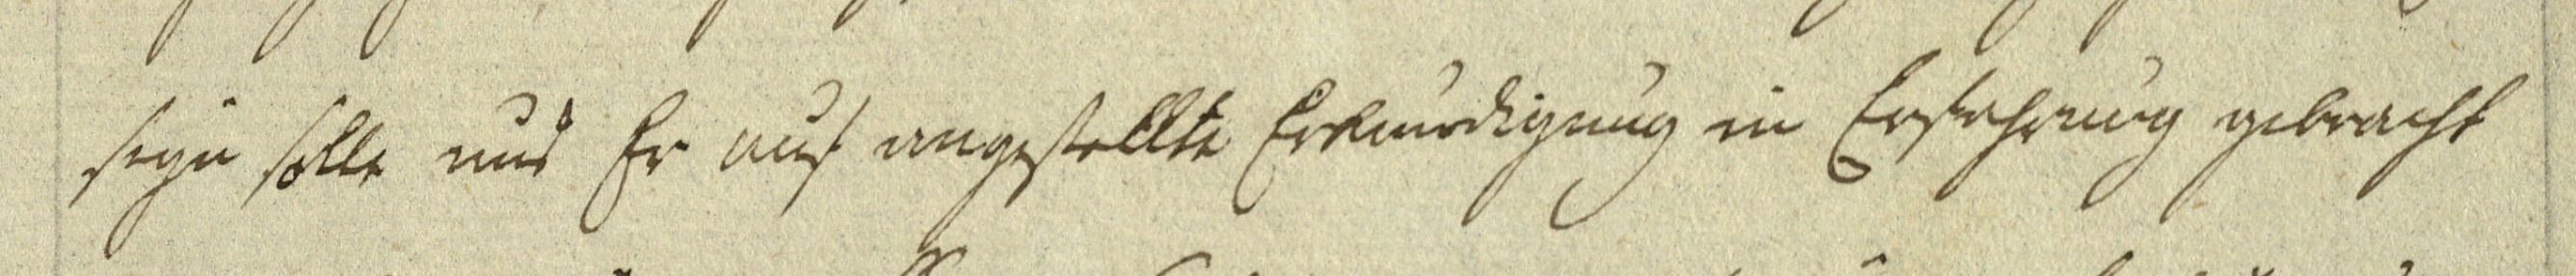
seÿn solle und Er auf angestellte Erkundigung in Erfahrung gebracht
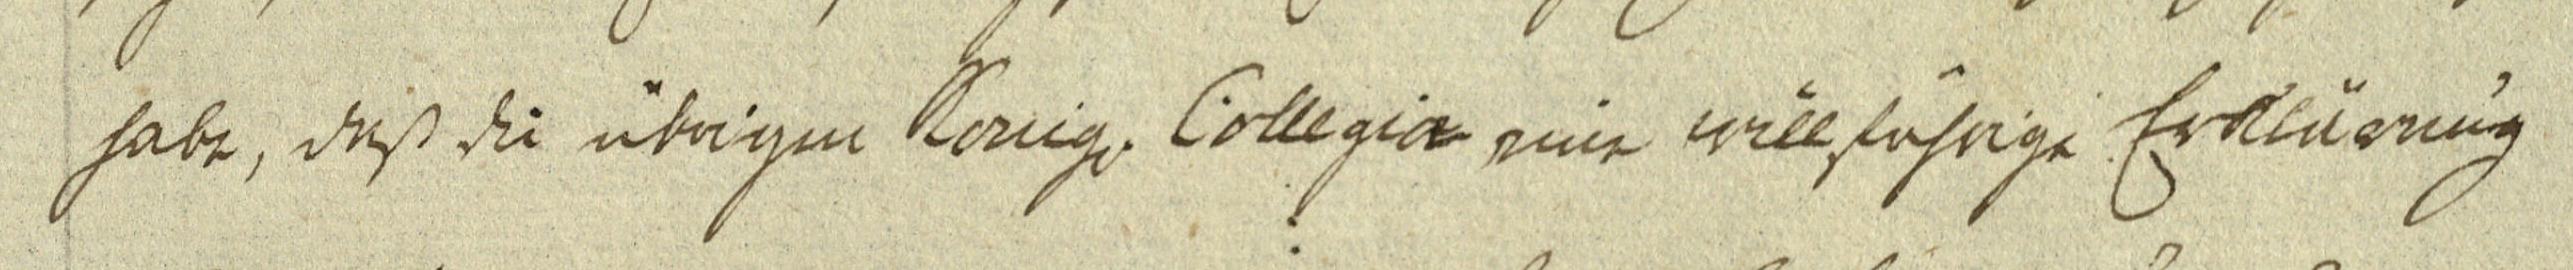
habe, daß die übrigen Königl. Collegiae eine willfährige Erklärung
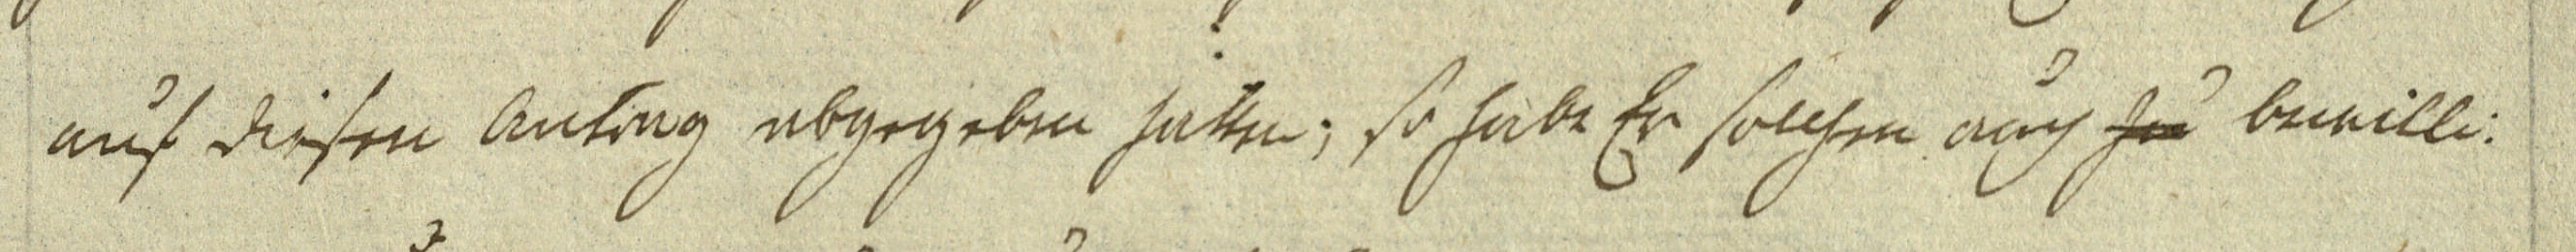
auf diesen Antrag abgegeben hätten, so habe Er solchen auch zu bewilli¬
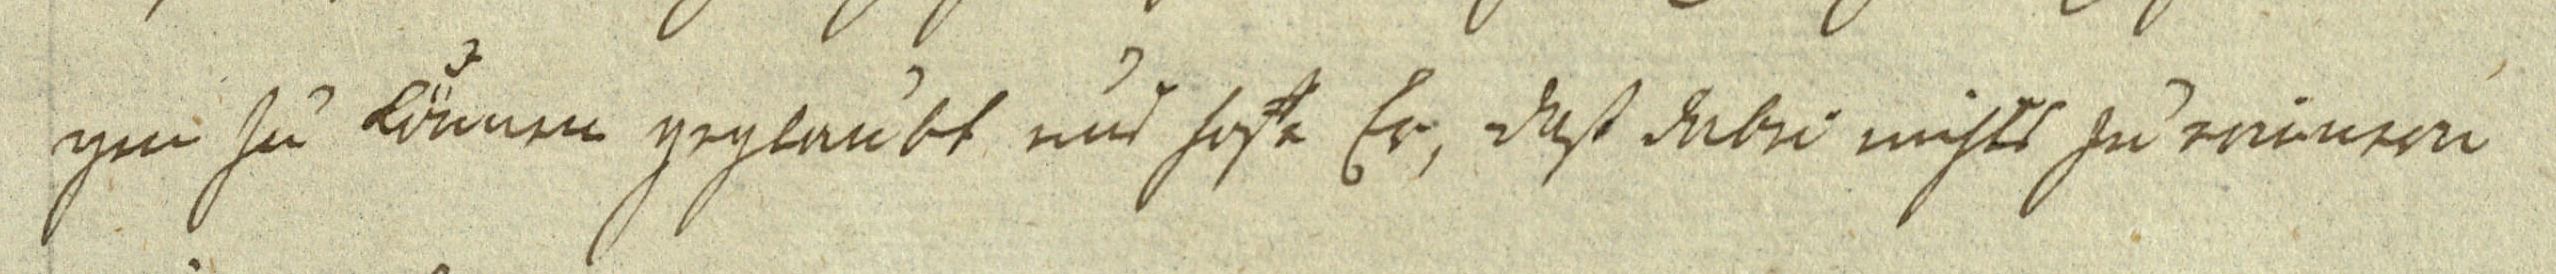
gen zu können geglaubt und hoffe Er, daß dabei nichts zu erinnern
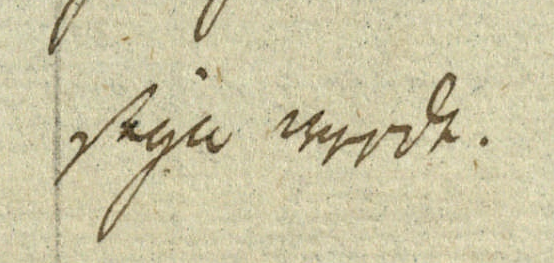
seÿn werde.
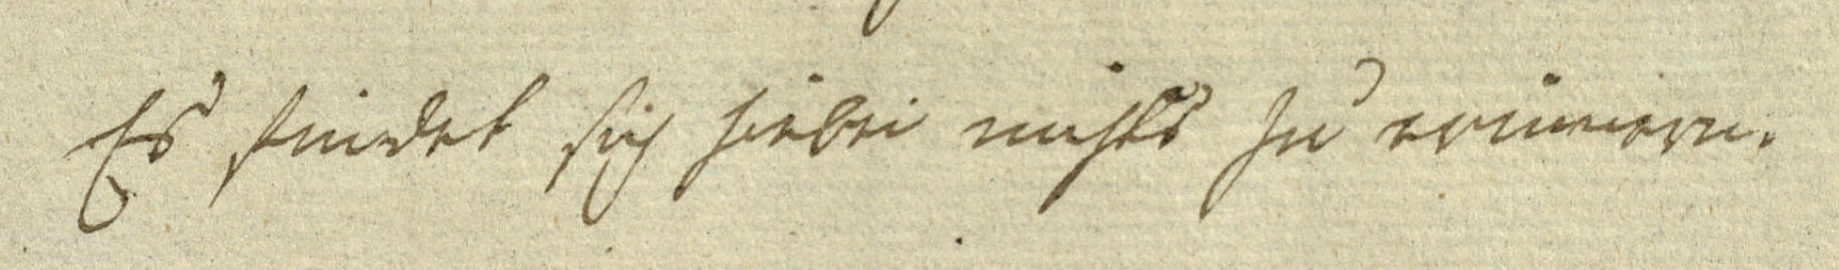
Es findet sich hiebei nichts zu erinnern.
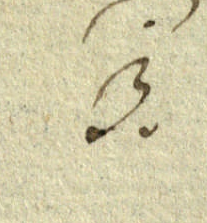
3.
